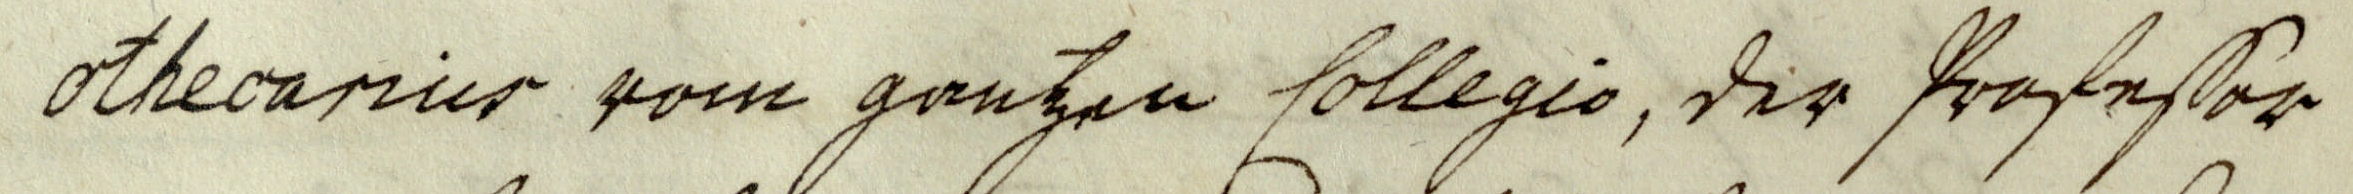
othecarius vom gantzen Collegio, der Professor
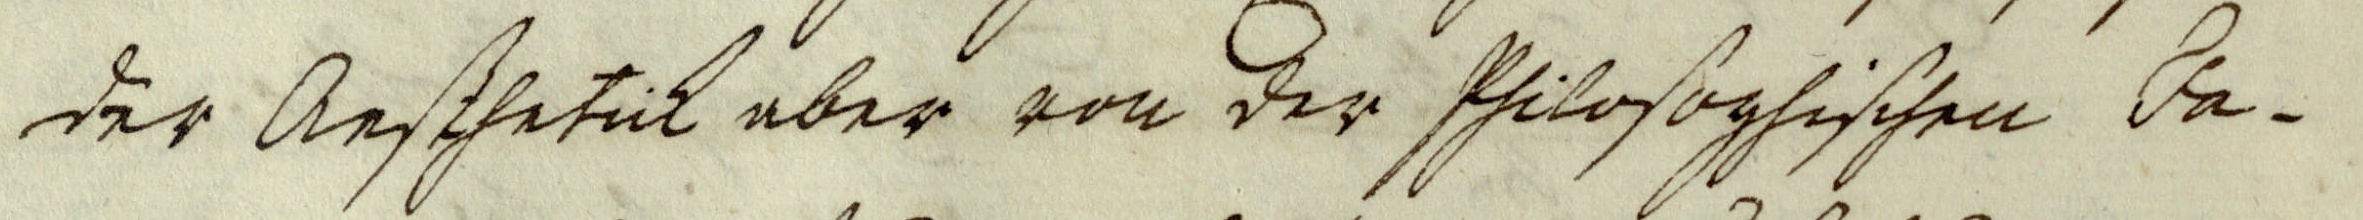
der Aesthetik aber von der Philosophischen Fa¬
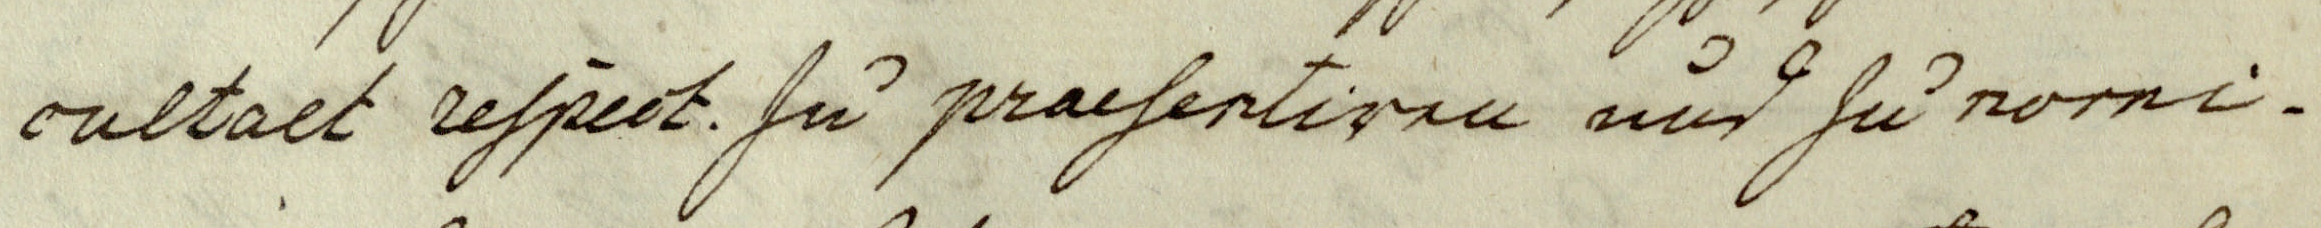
cultaet respect. zu praesentiren und zu nomi¬
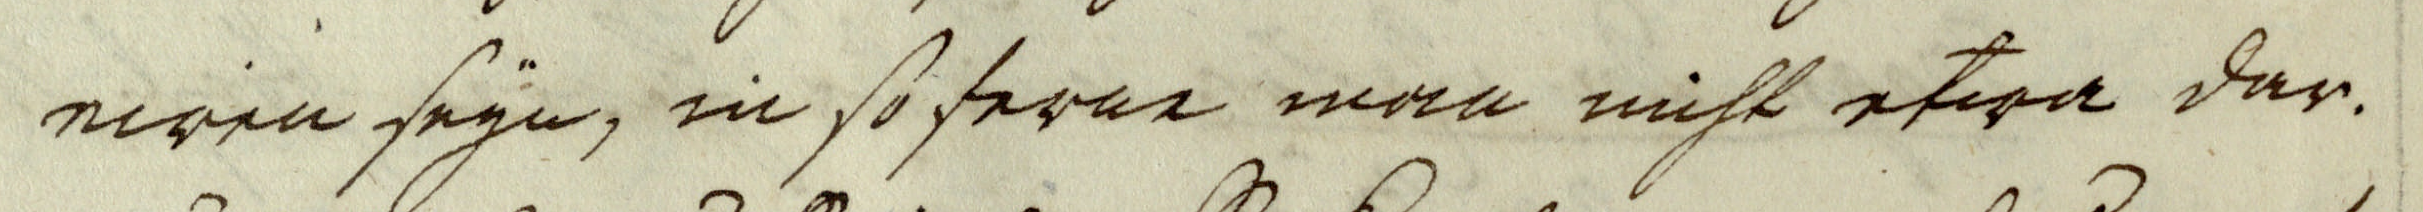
niren seÿn, in so ferne man nicht etwa dar¬
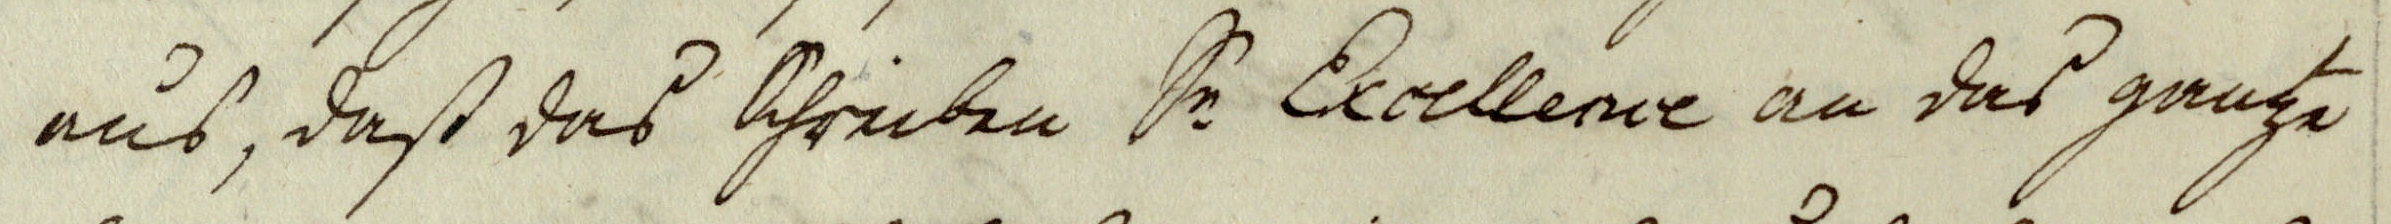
aus, daß das Schreiben Sr. Excellence an das gantze
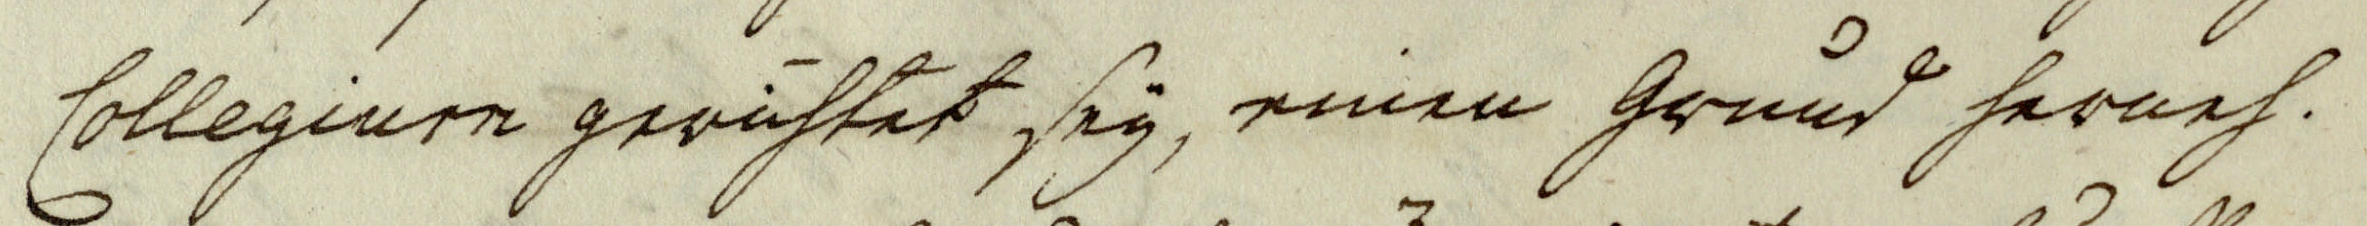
Collegium gerichtet seÿ, einen Grund herneh¬
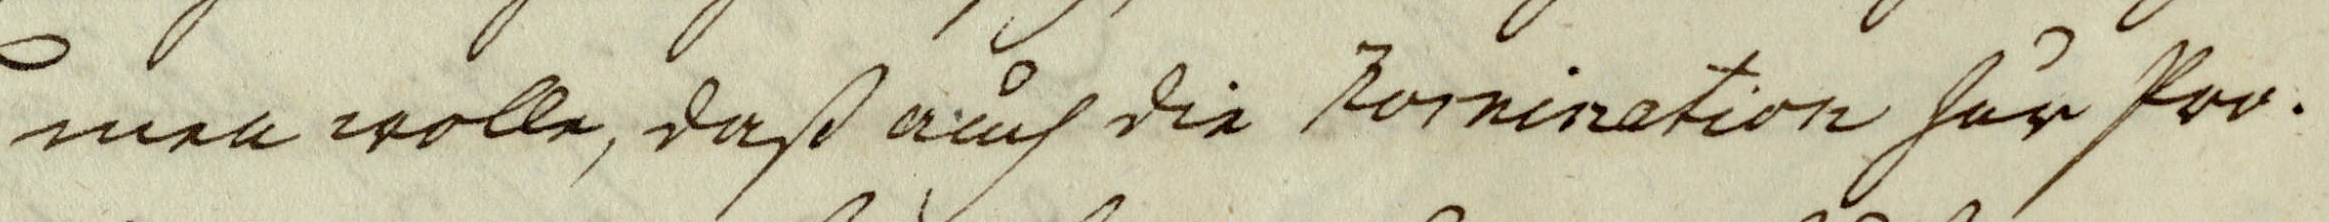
men wolle, daß auch die Nomination zur Pro¬
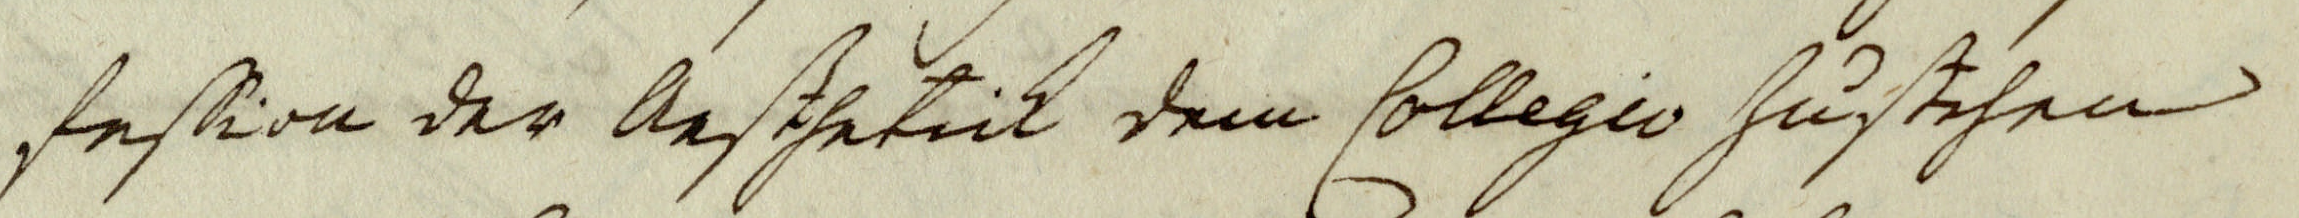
fession der Aesthetik dem Collegio zustehen
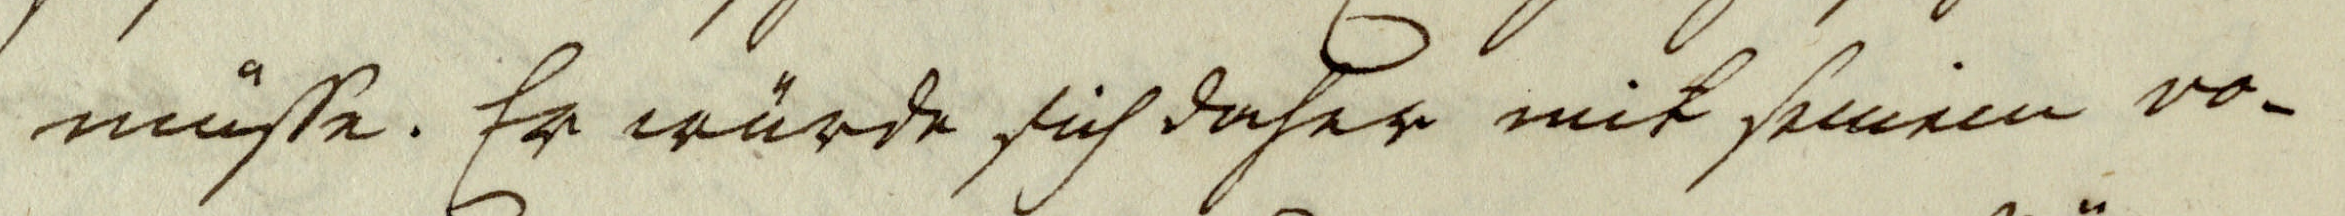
müsse. Er würde sich daher mit seinem voto
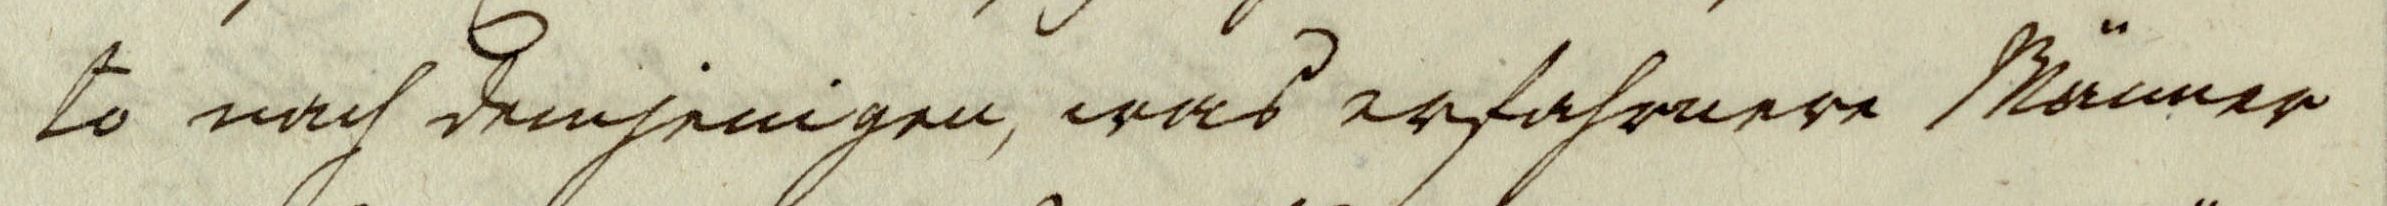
nach demjenigen, was erfahrene Männer
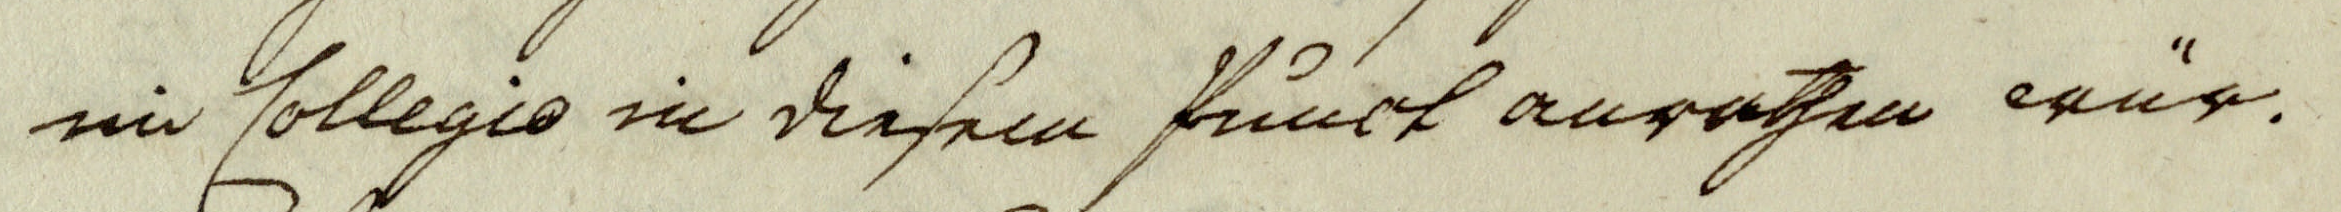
im Collegio in diesem Punct anrathen wür¬
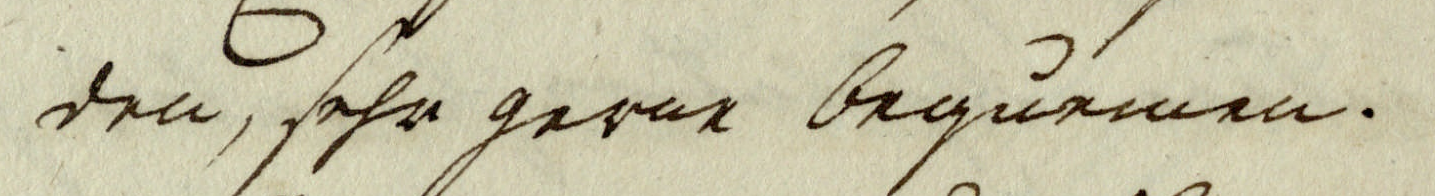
den, sehr gerne bequemen.
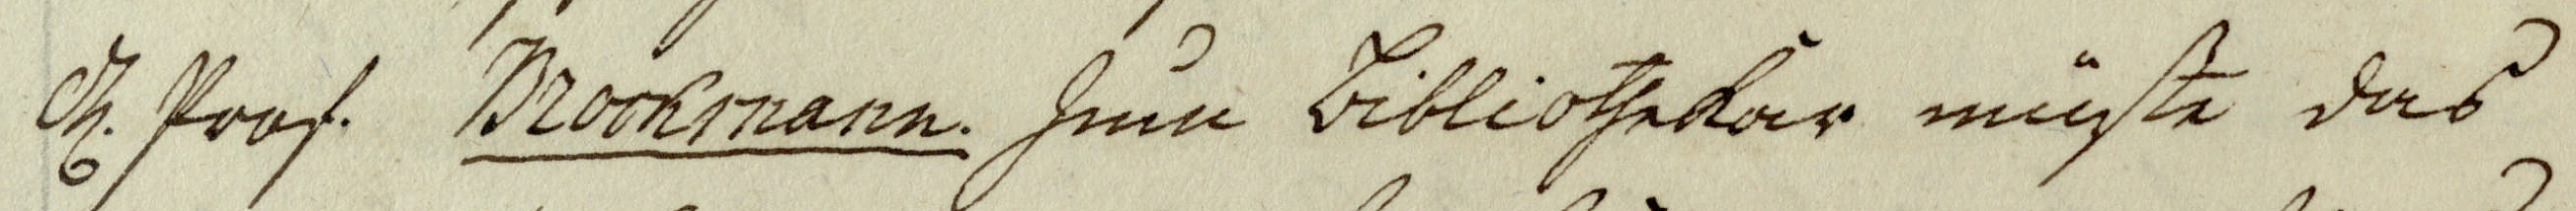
dh. Prof. Brockmann. Zum Bibliothekar müsste das
